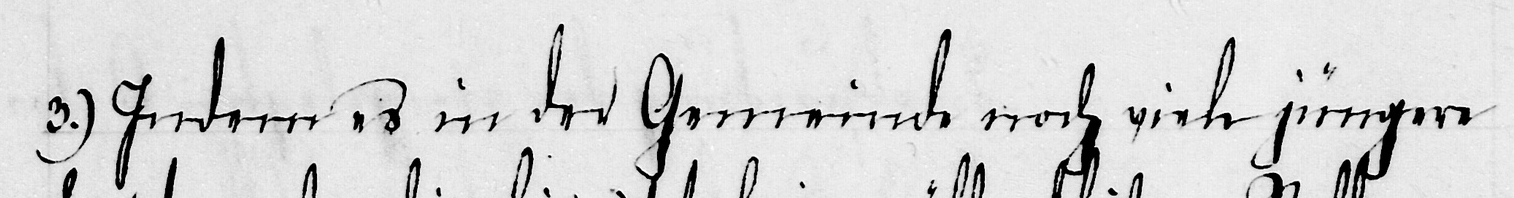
3.) Indem es in der Gemeinde noch viele jüngere
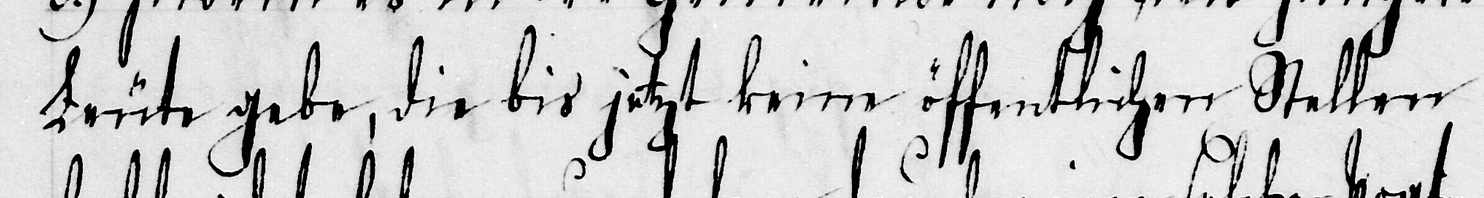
Leute gebe, die bis jetzt keine öffentlichen Stellen
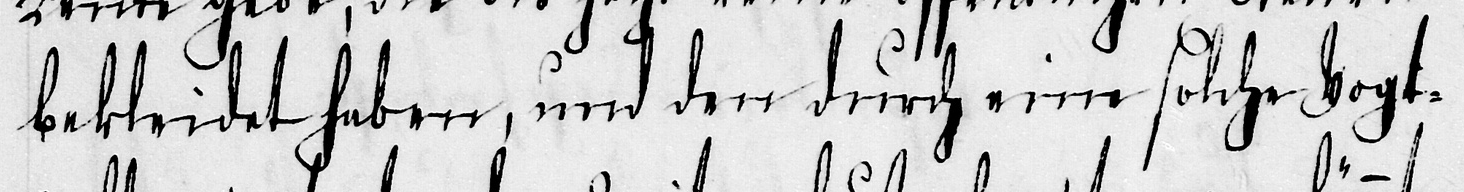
bekleidet haben, und den durch eine solche Vogt¬
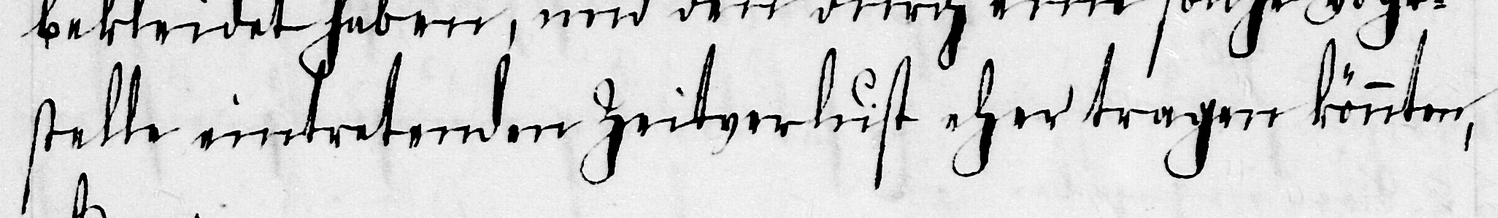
stelle eintretenden Zeitverlust eher tragen könnten,
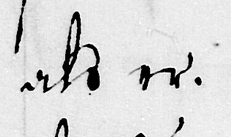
als er.
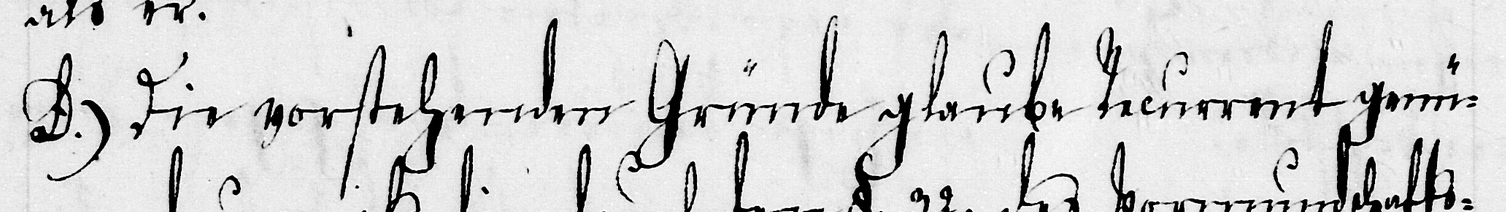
D.) Die vorstehenden Gründe glaube Recurrent genü¬
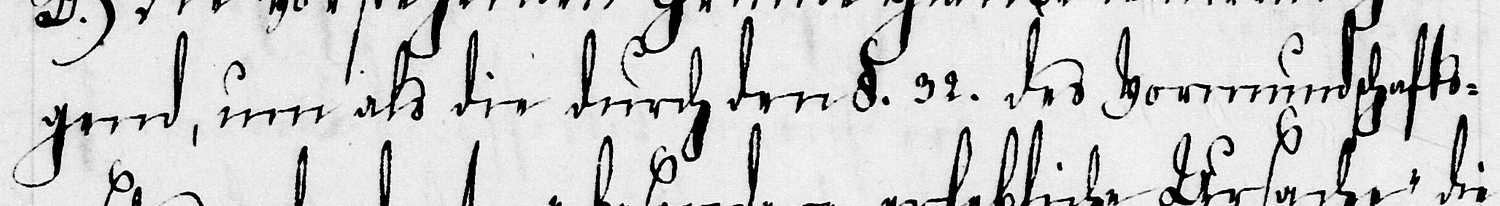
gend, um als die durch den §. 32. des Vormundschaft¬
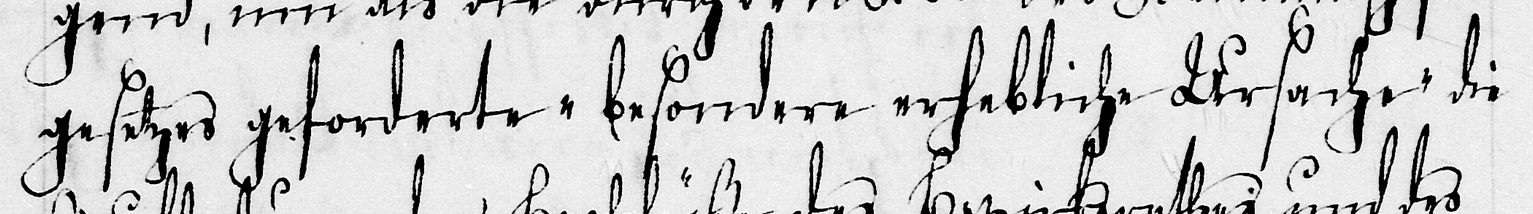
sgesetzes geforderte „besondere erhebliche Ursache“ die
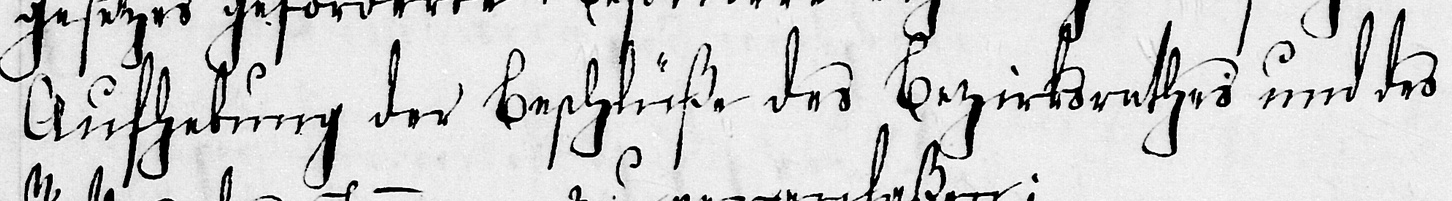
Aufhebung der Beschlüße des Bezirksrathes und des
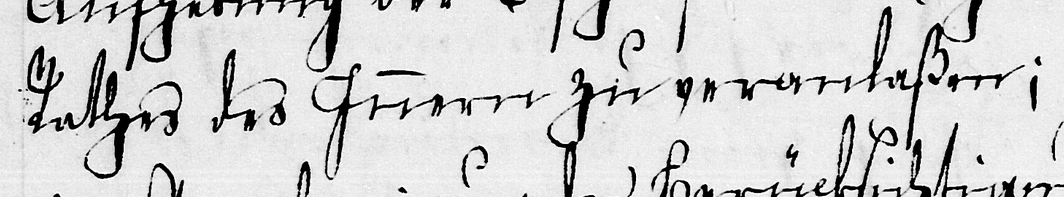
Rathes des Innern zu veranlaßen;
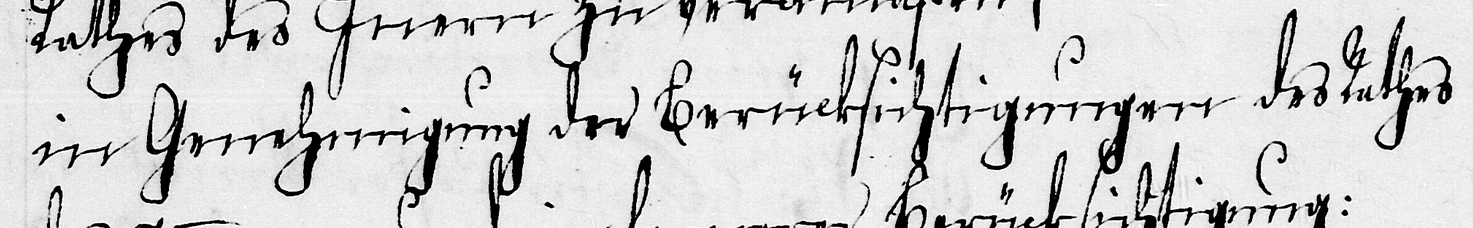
in Genehmigung der Berücksichtigungen des Rathes
